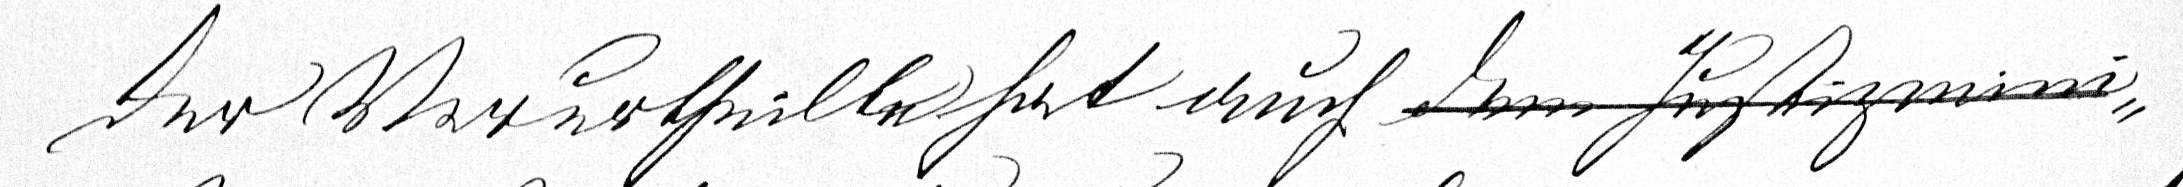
Der Verertheilte auch
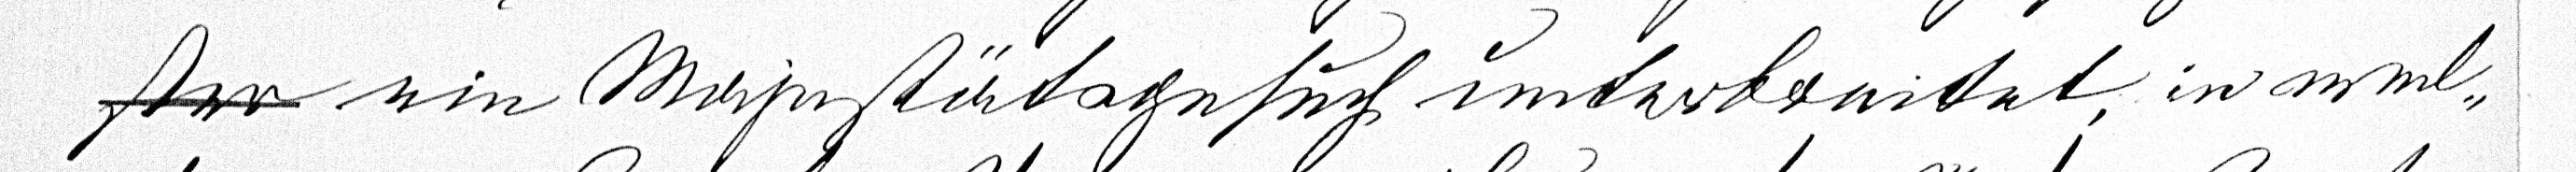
ein Majestätsgesuch unterbreitet, in wel¬
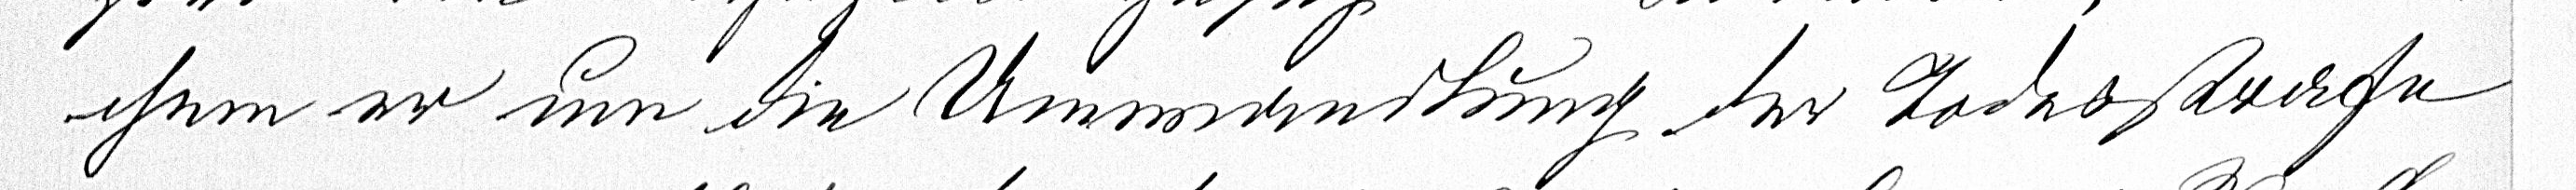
chem er um die Umwandlung der Todesstrafe
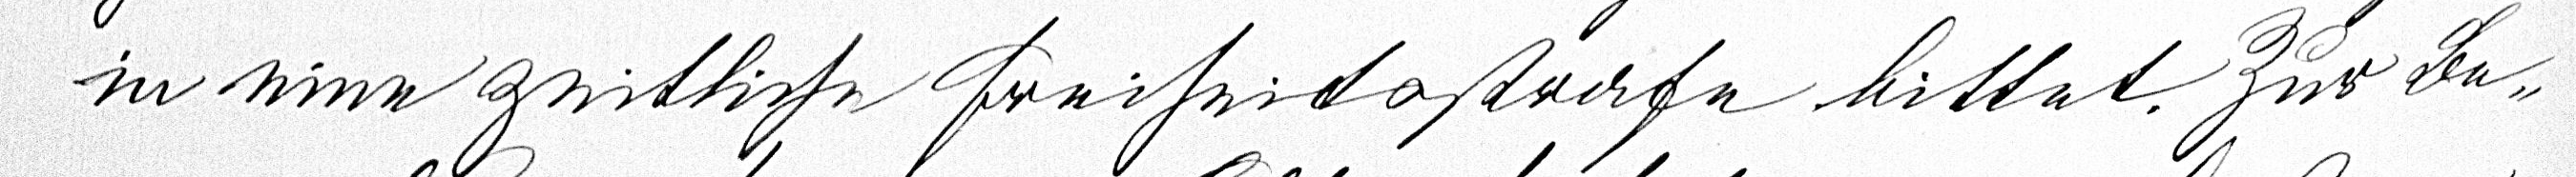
in eine zeitliche Freiheitsstrafe bittet. Zur Be¬
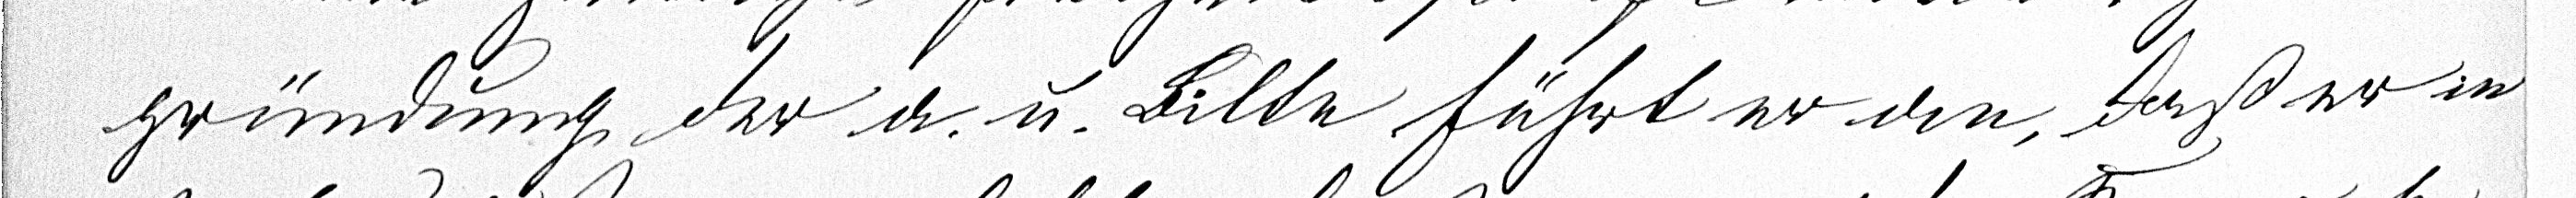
gründung der a. u. Bilte fährt er an, daß er in
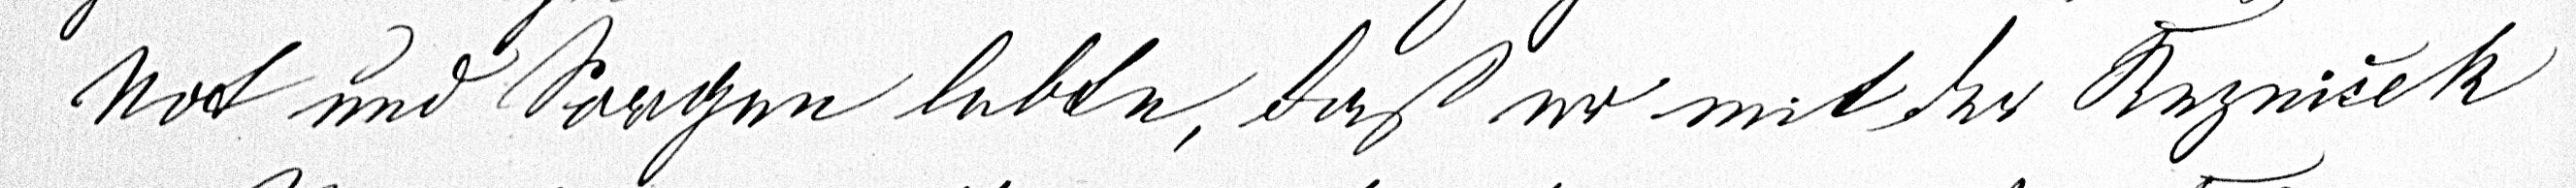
Not und Sorgen lebte, das er mit der Rezniček
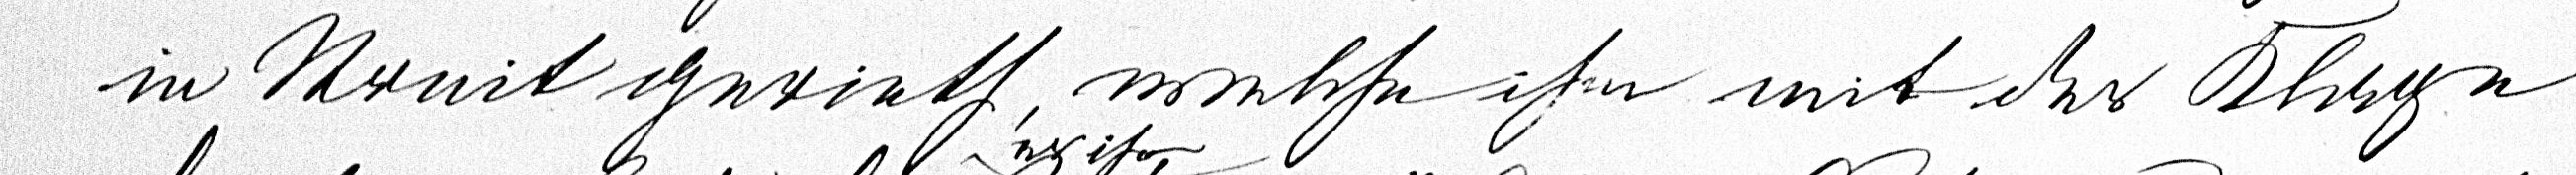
in Streit Gerieth welche ihm mit der Klage
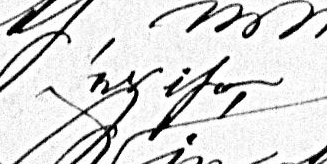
er ihr
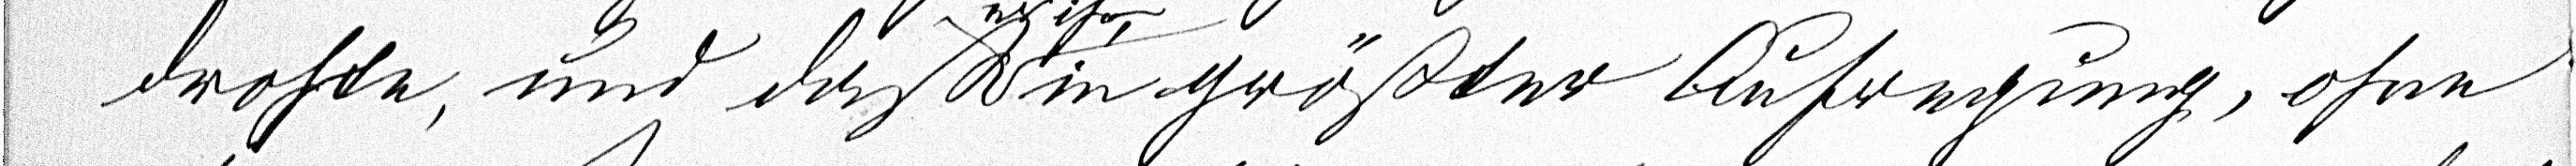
drohte, und daß in größter Aufregung, ohne
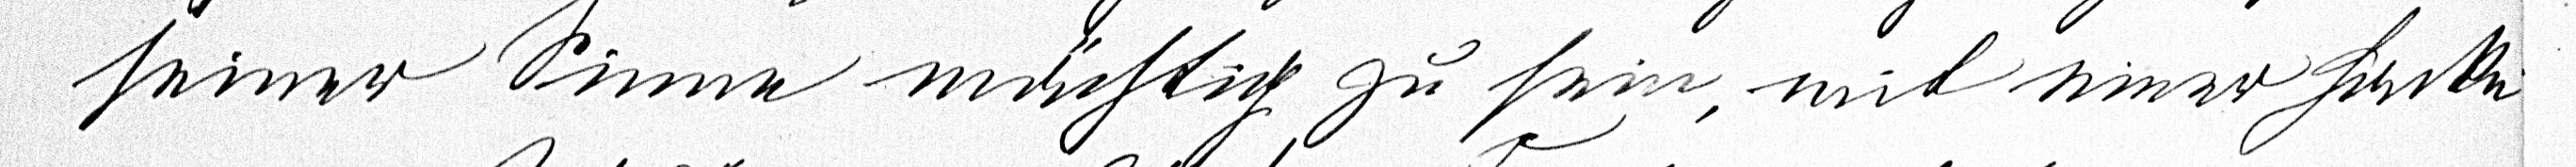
seiner Sinne mächtig zu sein, mit einer Hacke
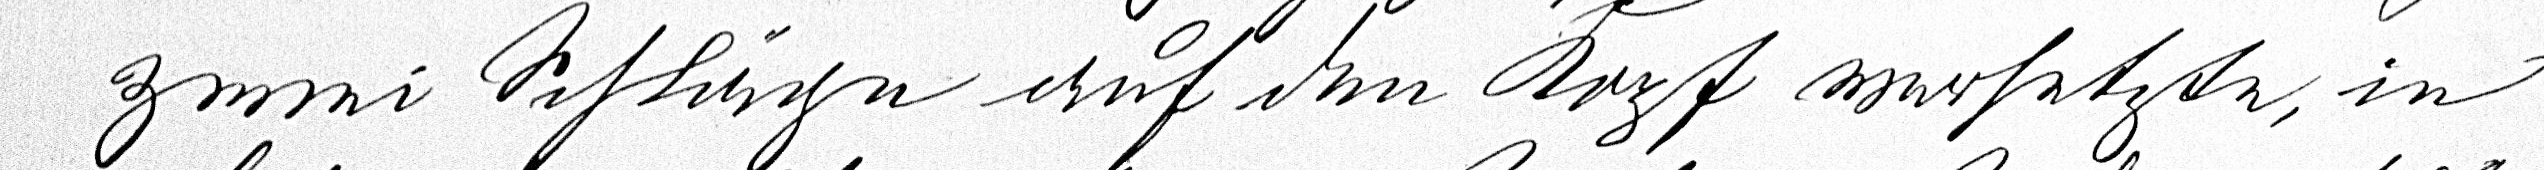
zwei Schläge auf den Kopf versetzte, in
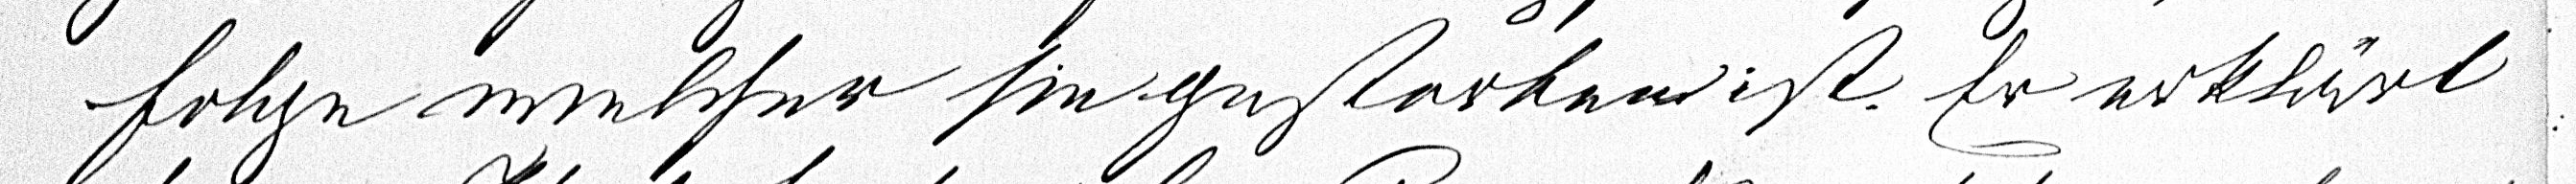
folge welcher sie gestorben ist. Er erklärt
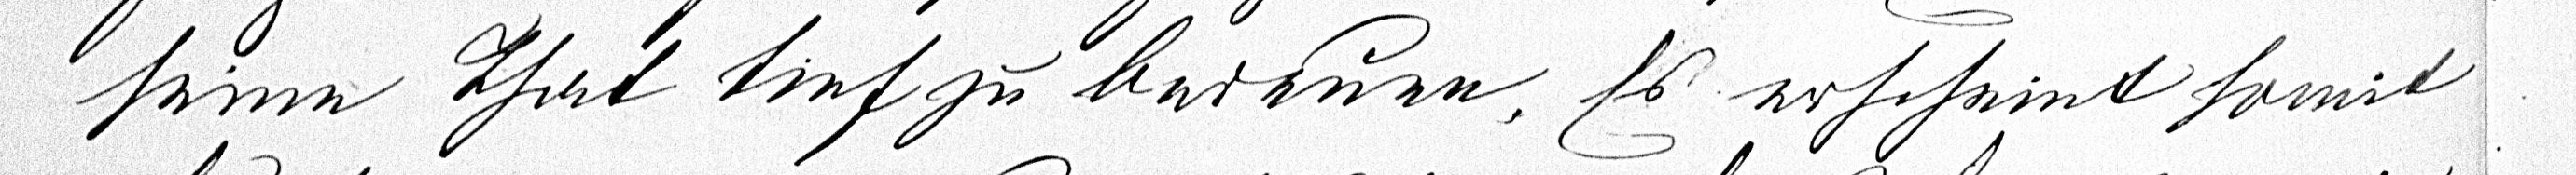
seine That tief zu bereuen. Es erscheint somit
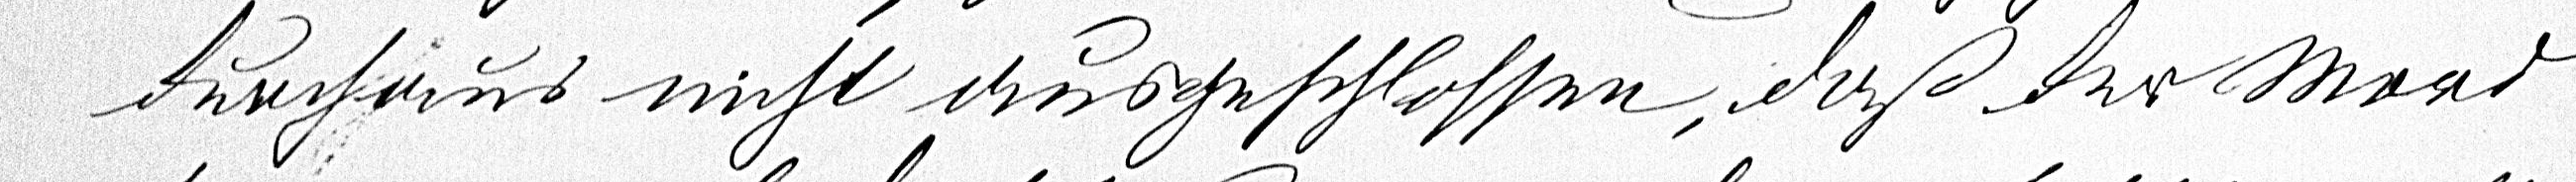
durchaus nicht ausgeschlossen, daß der Mord
